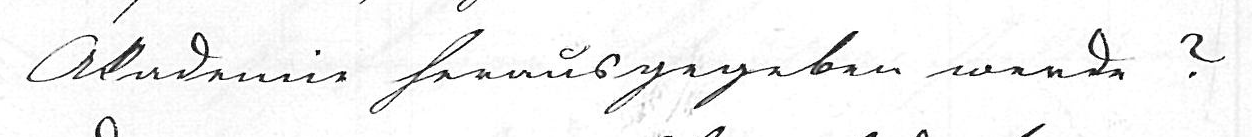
Akademie herausgegeben werde?
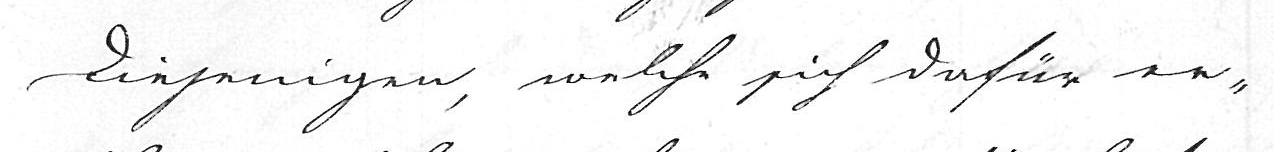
Diejenigen, welche sich dafür er-
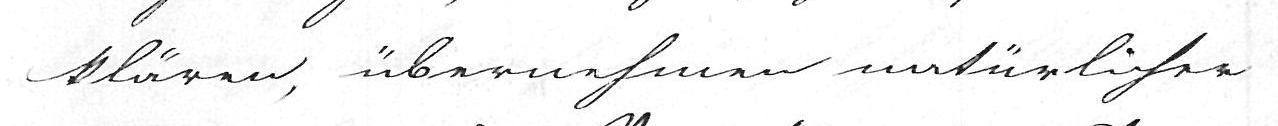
klären, übernehmen natürlicher
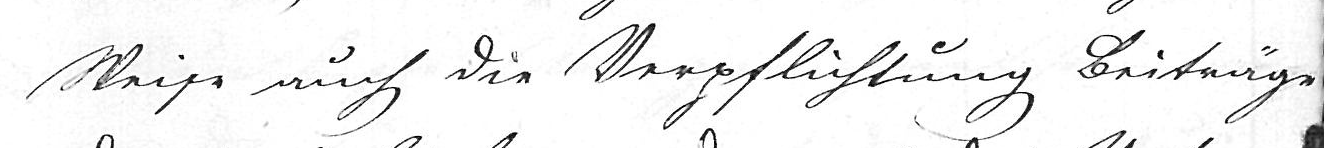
Weise auch die Verpflichtung Beiträge
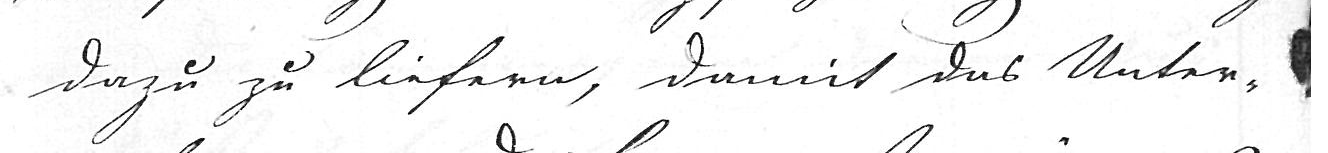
dazu zu liefern, damit das Unter-
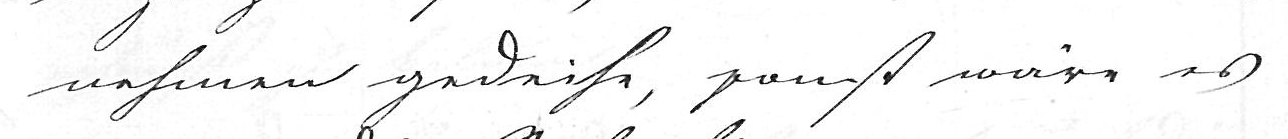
nehmen gedeihe, sonst wäre es
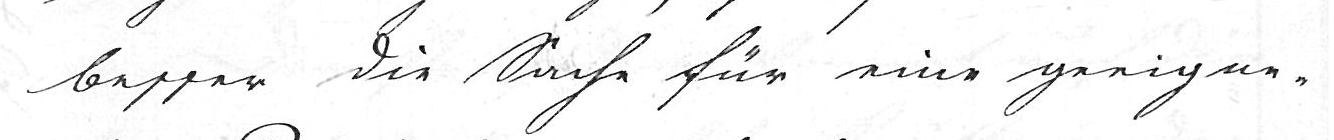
besser die Sache für eine geeigne-
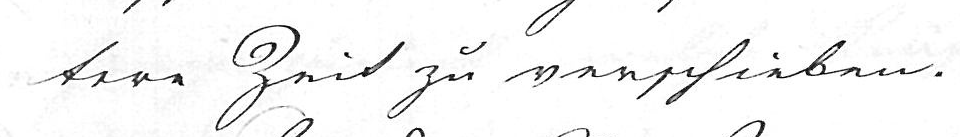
terer Zeit zu verschieben.
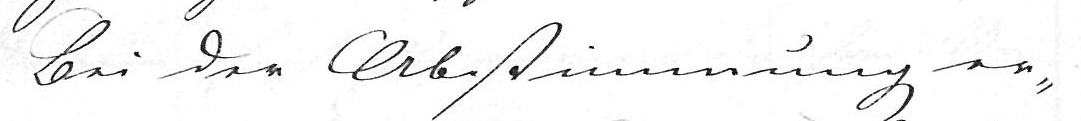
Bei der Abstimmung er-
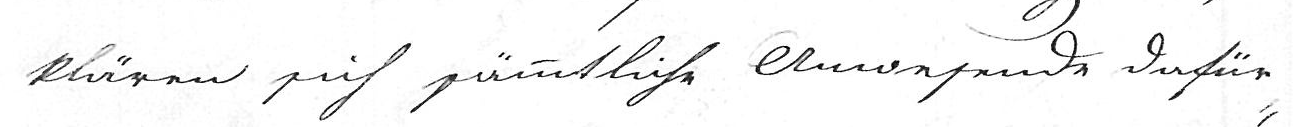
klären sich sämmtliche Anwesende dafür,
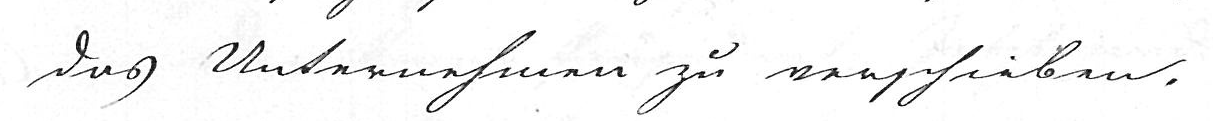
das Unternehmen zu verschieben.
